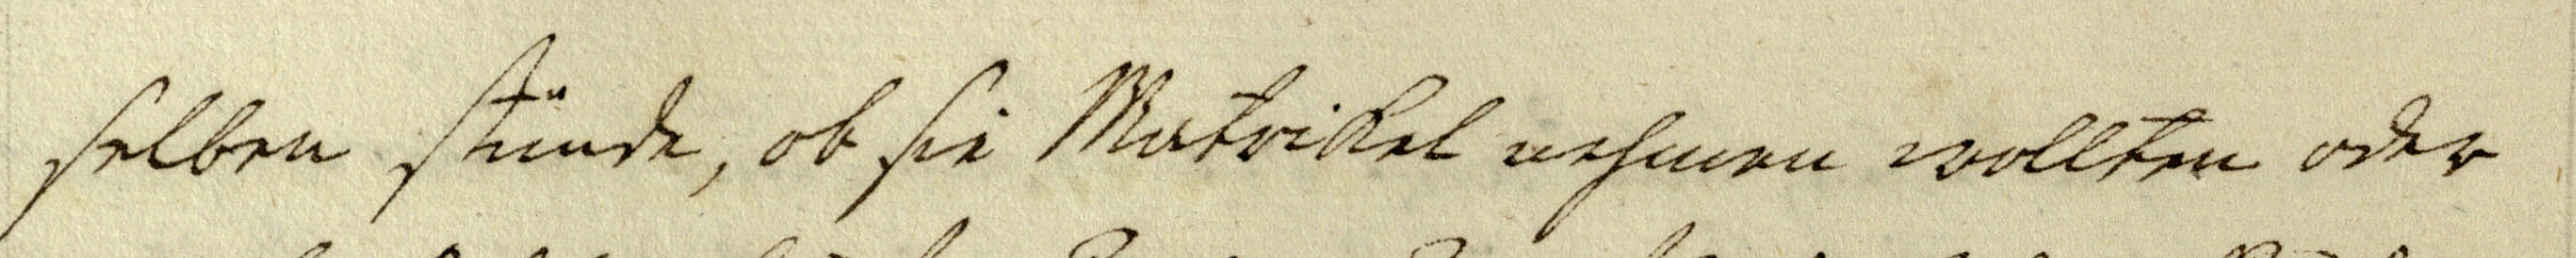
selben stünde, ob sie Matrikel nehmen wollten oder
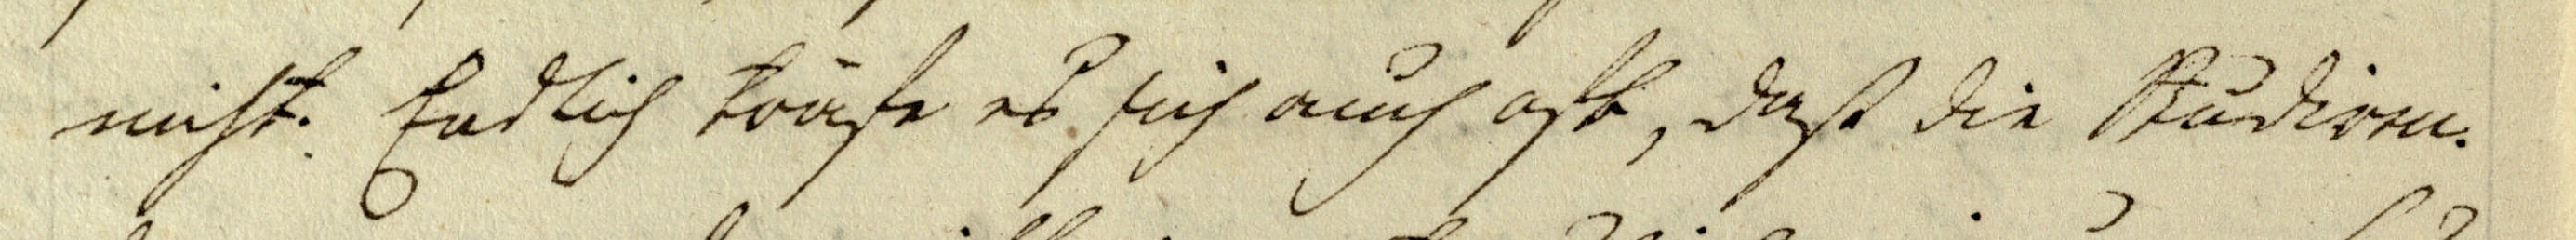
nicht. Endlich träfe es sich auch oft, daß die Studiren¬
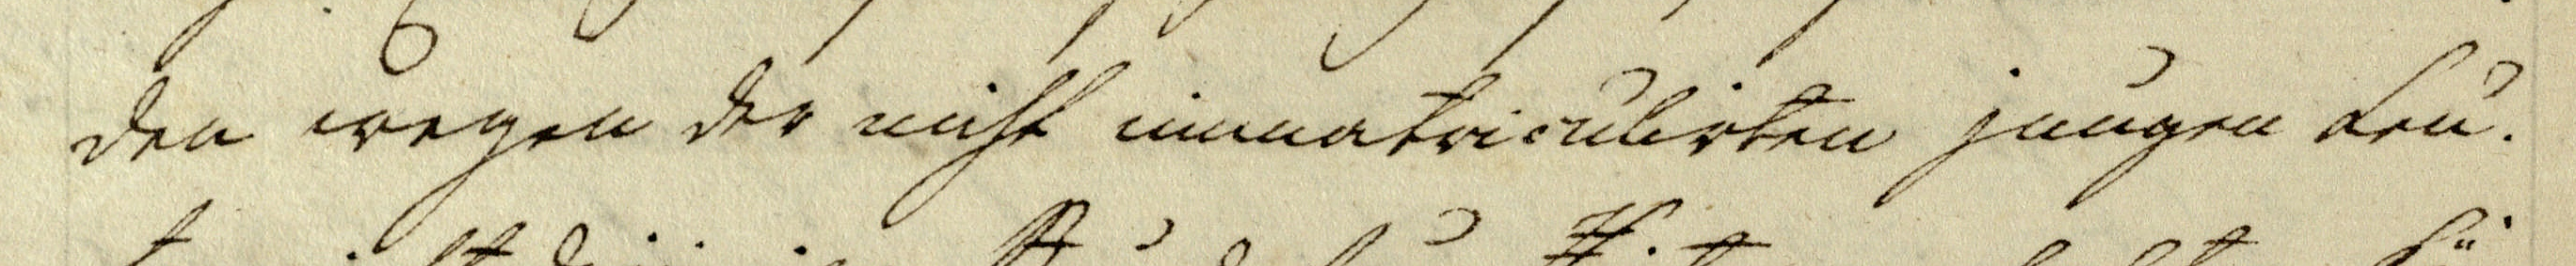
den wegen der nicht immatriculirten jungen Leu¬
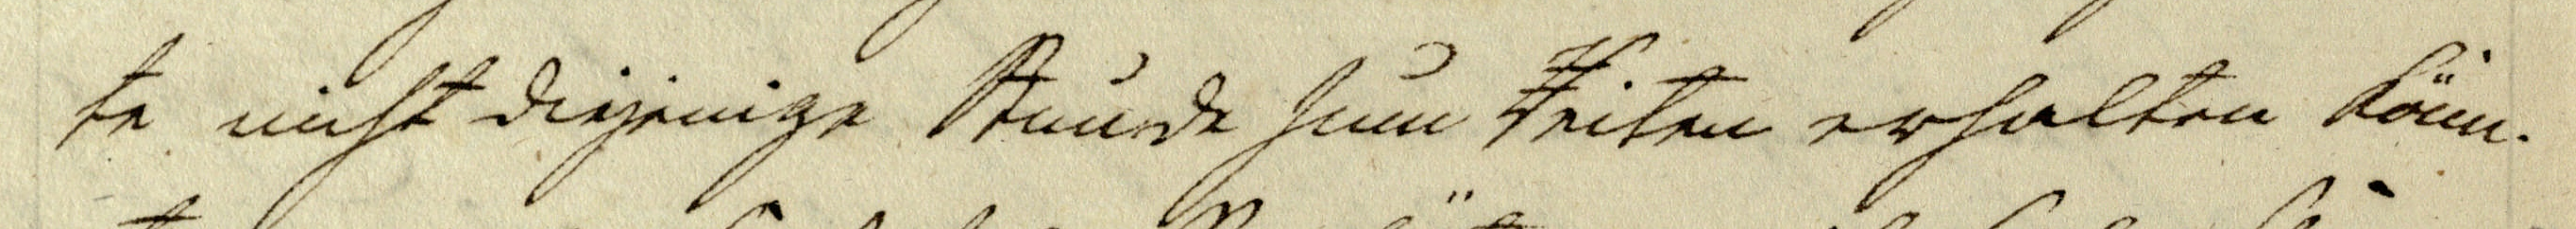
te nicht diejenige Stunde zum Reiten erhalten könn¬
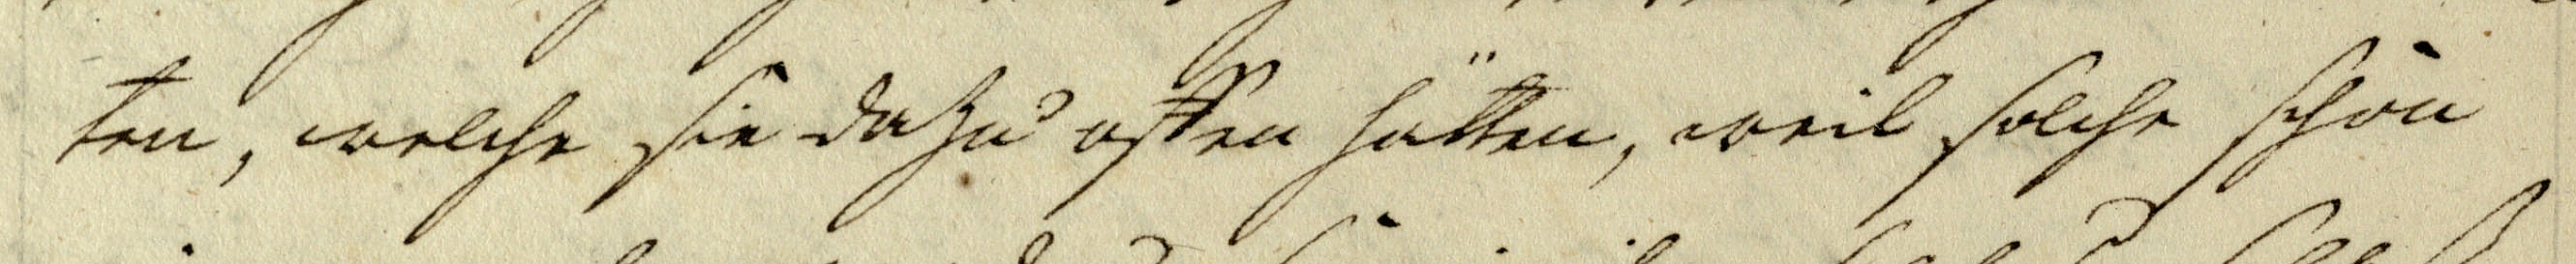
ten, welche sie dazu offen hätten, weil solche schon
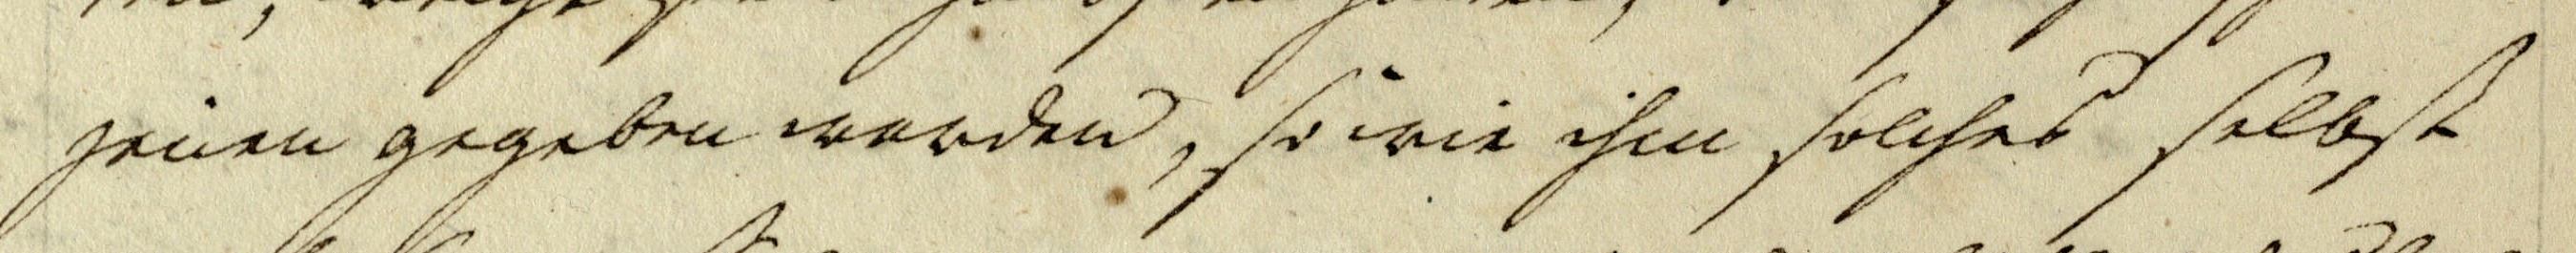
jenen gegeben worden, so wie ihm solches selbst
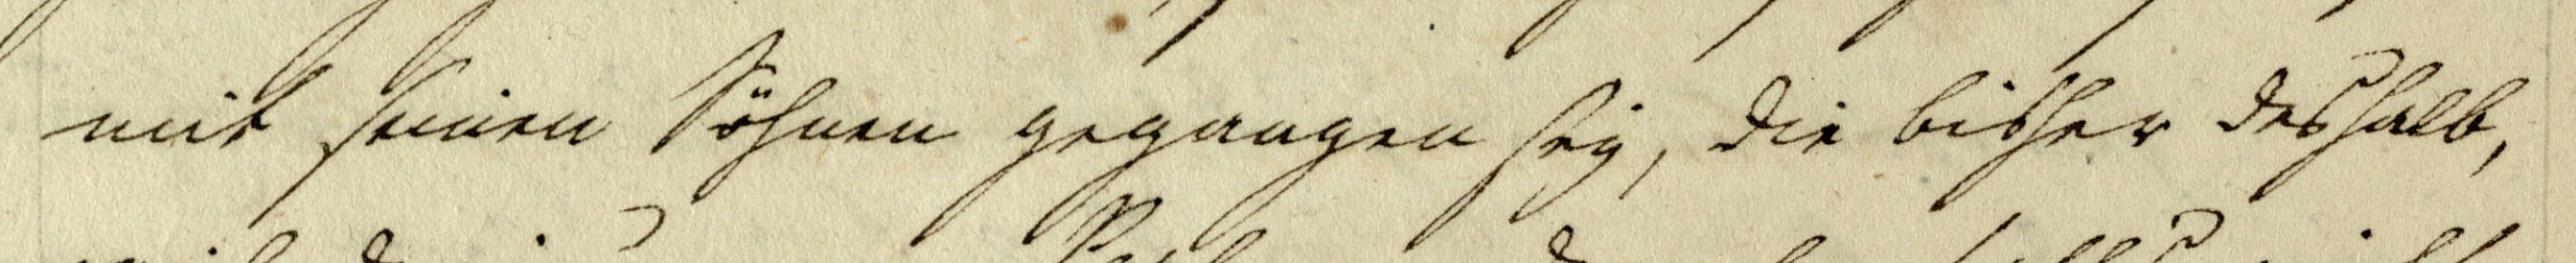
mit seinen Söhnen gegangen seÿ, die bisher deshalb,
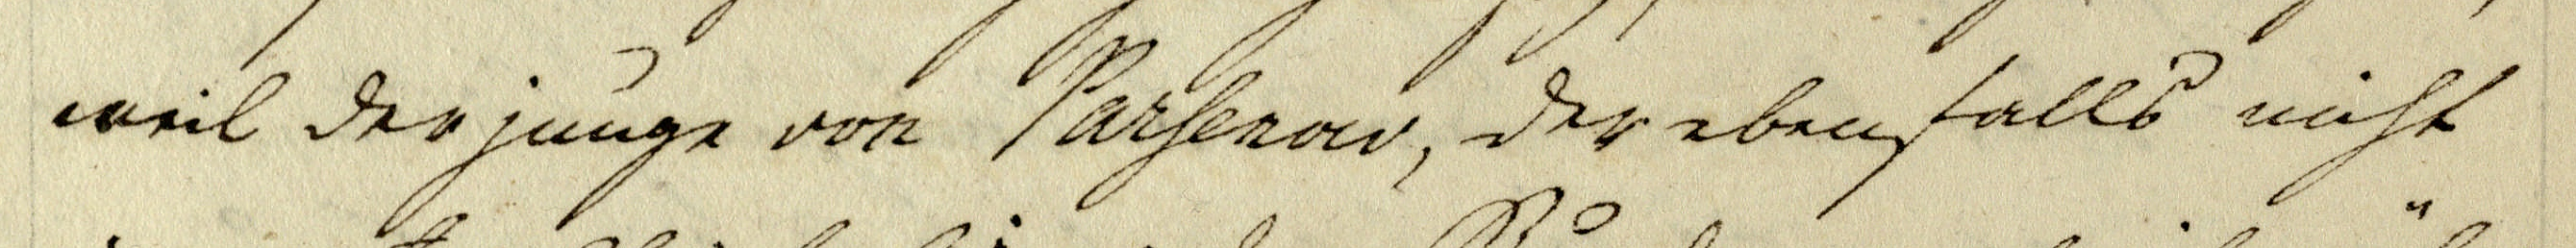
weil der jungen von Parsenow, der ebenfalls nicht
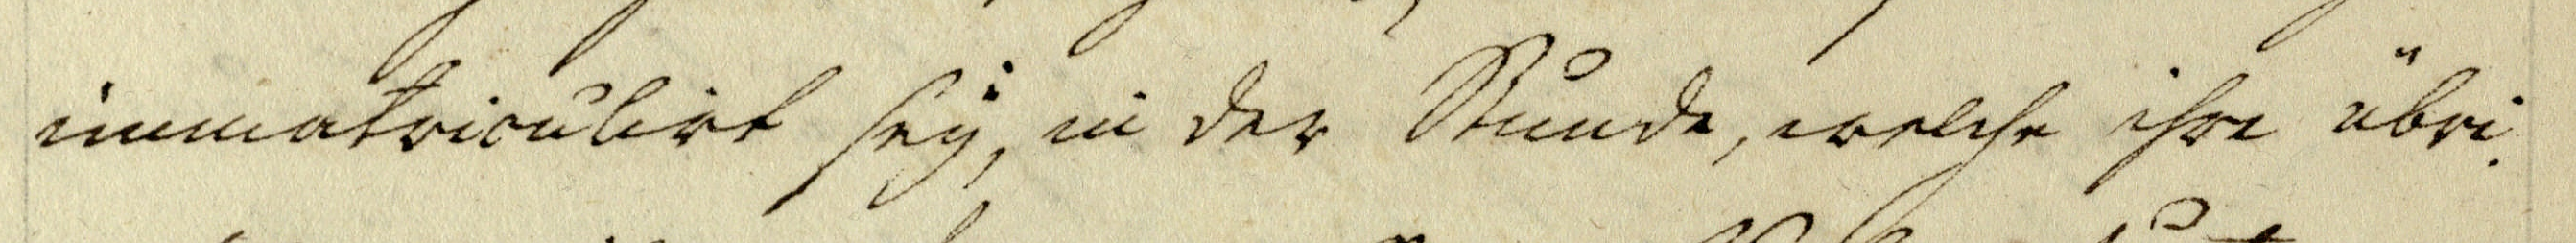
immatriculirt seÿ, in der Stunde, welche ihre übri¬
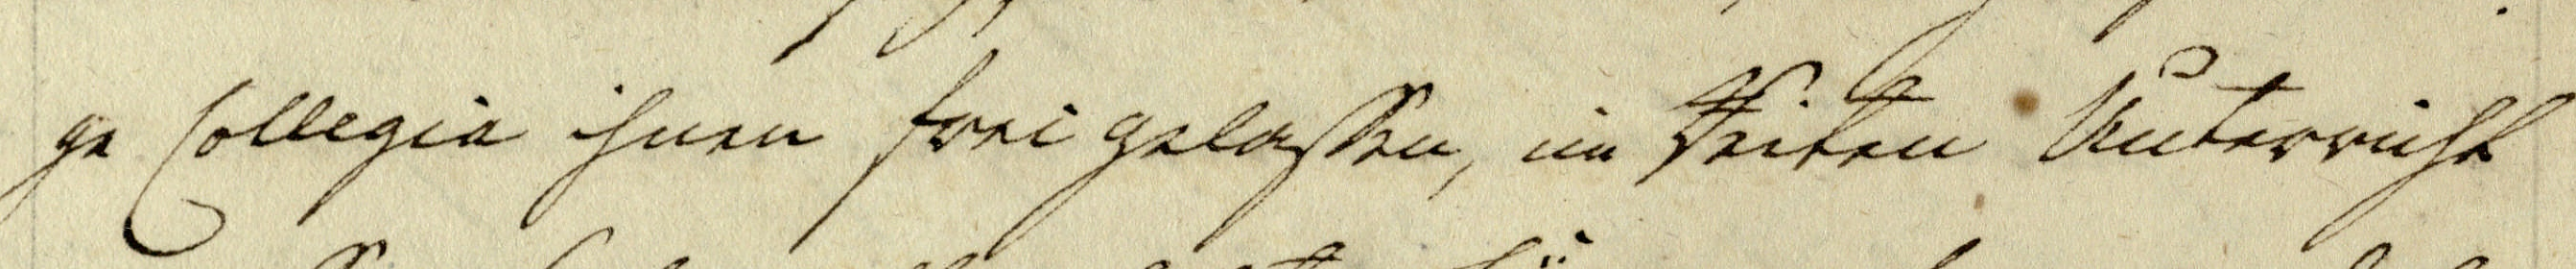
ge Collegia ihnen frei gelassen, im Reiten Unterricht
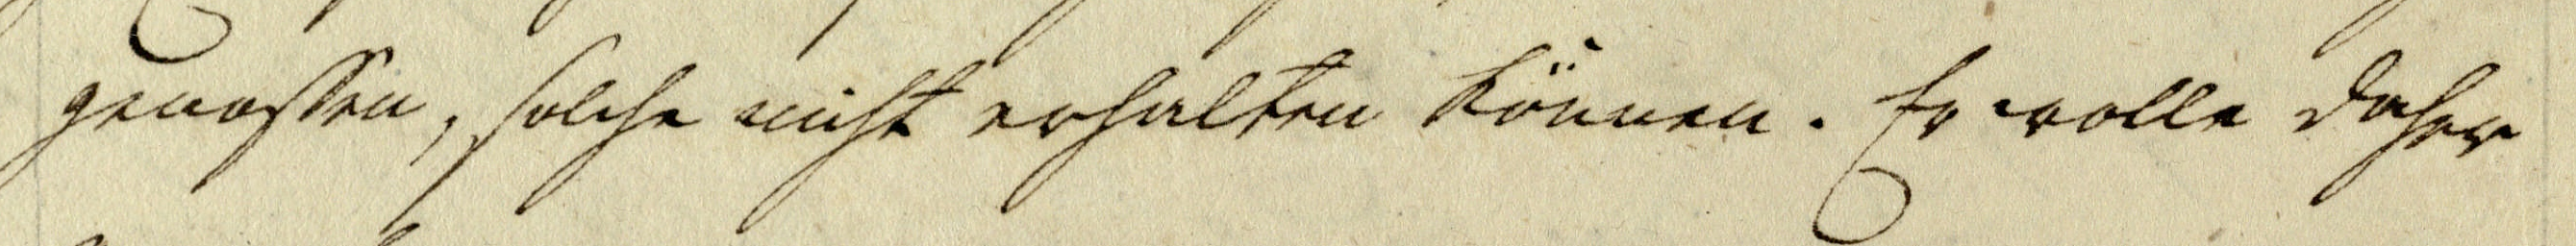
genossen, solche nicht erhalten können. Er wolle daher
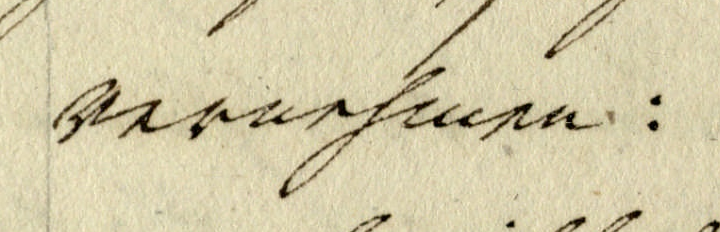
vernehmen:
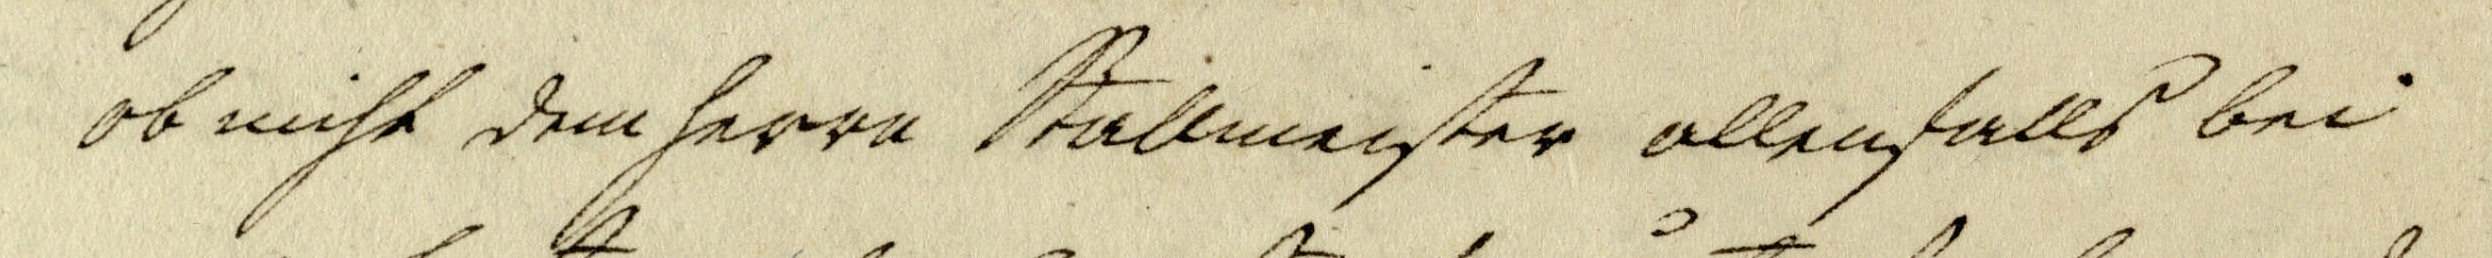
ob nicht dem Herrn Stalmeister allenfalls bei
